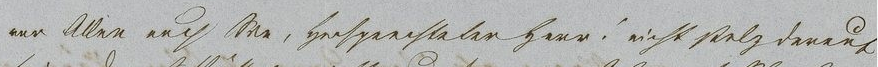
vor Allem auch Sie, Hochgeachteter Herr! nicht stolz darauf
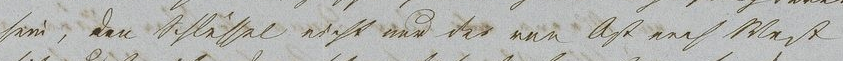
sein, den Schlüssel nicht nur des von Ost nach West
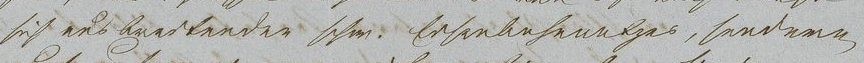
sich ausbreitenden schw. Eisenbahnnetzes, sondern
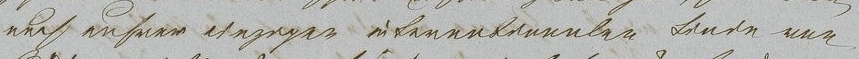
auch unsrer einzigen internationalen Linien von
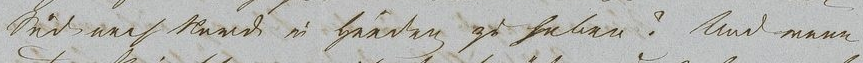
Süd nach Nord in Händen zu haben? Und wenn
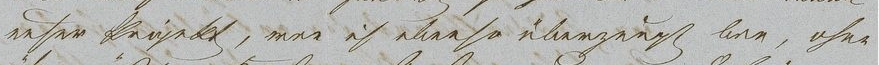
unser Projekt, wie ich ebenso überzeugt bin, ohne
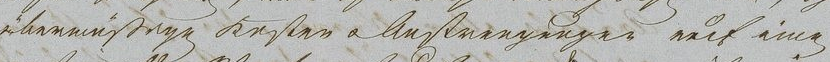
übermäßige Kosten & Anstrengungen auf eine
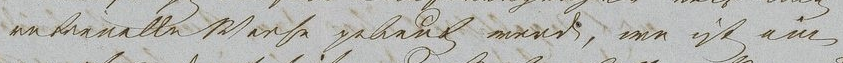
rationelle Weise gebaut wird, wo ist ein
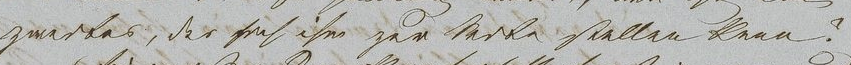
zweites, das sich ihm zur Seite stellen kann?
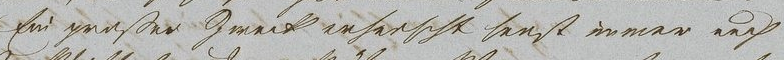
Ein großer Zweck erheischt sonst immer auch
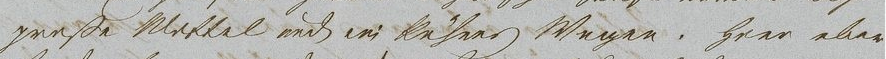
große Mittel und ein kühnes Wagen. Hier aber
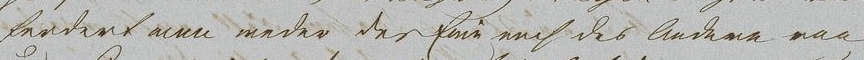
fordert man weder das Eine noch das Andere von
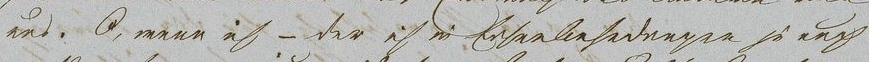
uns. O, wenn ich – der ich in Eisenbahndingen ja auch
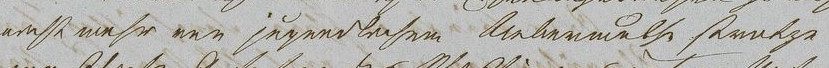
nicht mehr von jugendlichem Uebermuth strotze –
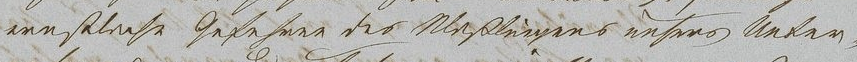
ernstliche Gefahren des Mißlingens unsres Unter-
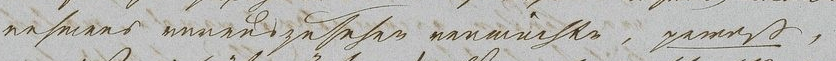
nehmens vorauszusehen vermöchte, gewiß,
